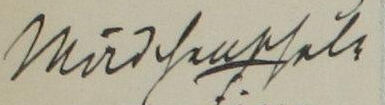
Mädchenschule
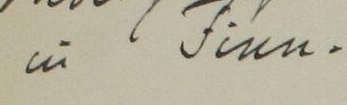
in Finn
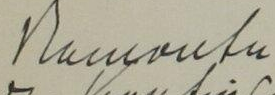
Remonte
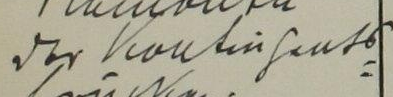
der Kontingents-
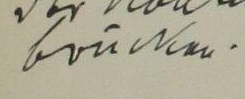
brücken
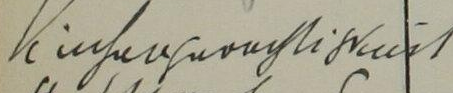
Kirchengerechtigkeit
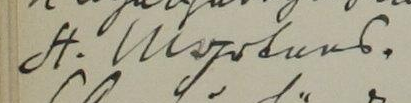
St. Martens.
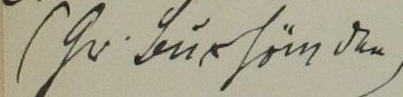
(Gr. Buxhöwden
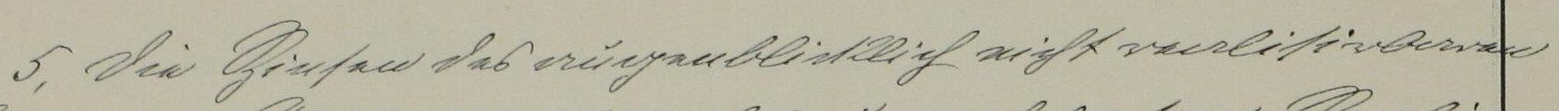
5. Die Zinsen des augenblicklich nicht realisirbaren
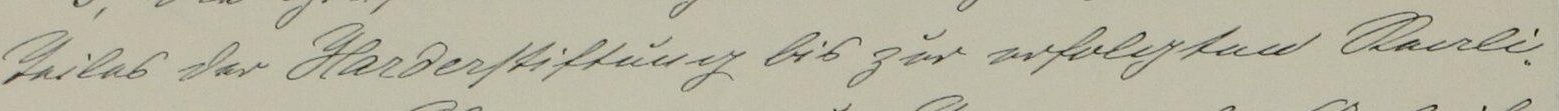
Teiles der Harderstiftung bis zur erfolgten Reali-
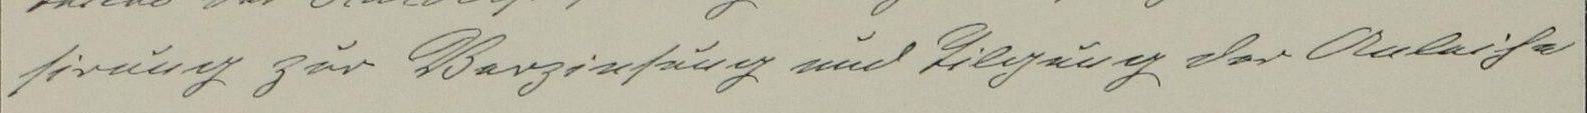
sirung zur Verzinsung und Tilgung der Anleihe
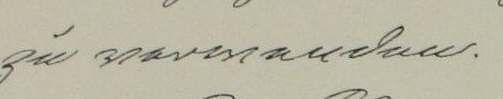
zu verwenden.
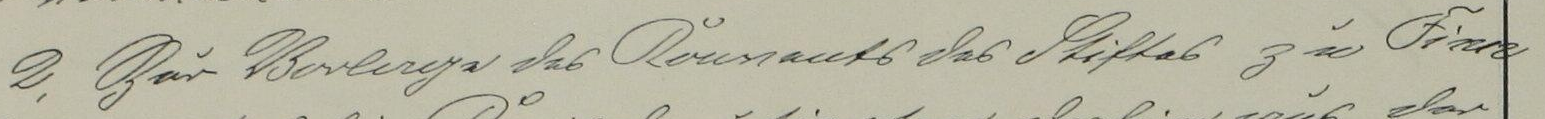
2. Zur Vorlage des Konvents des Stiftes zu Finn
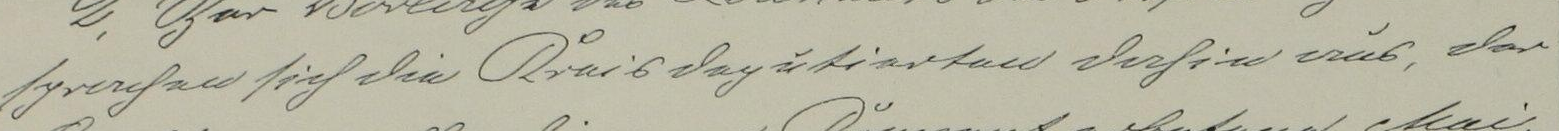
sprachen sich die Kreisdeputierten dahin aus, der
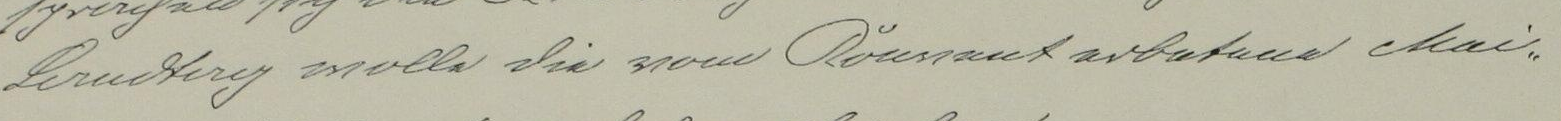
Landtag wolle die vom Konvent erbetene Mei-
